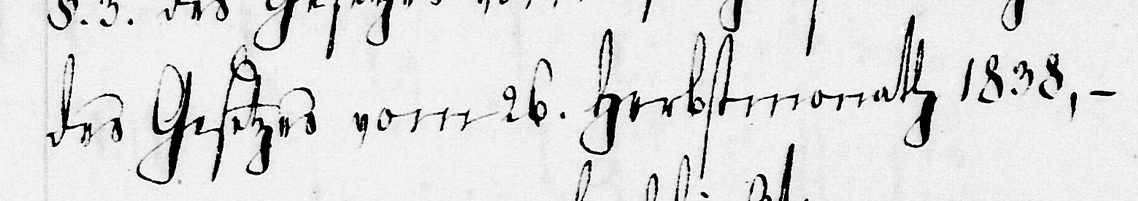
des Gesetzes vom 26. Herbstmonath 1838, –
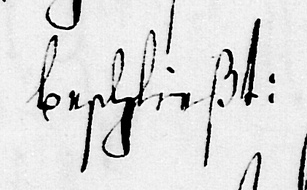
beschließt:
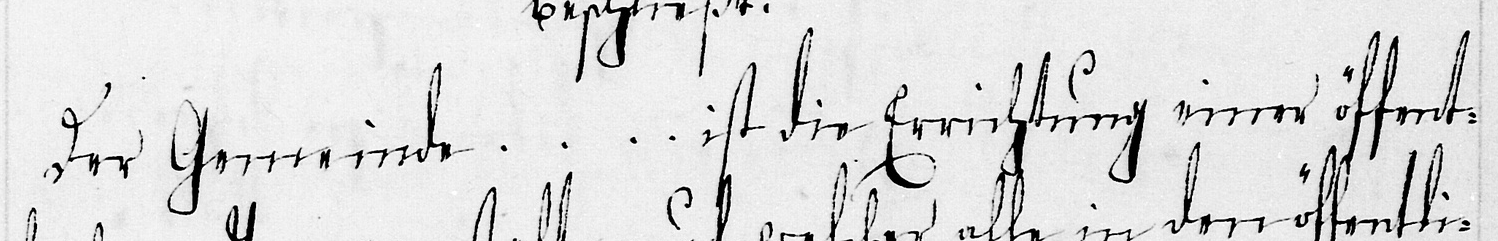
Der Gemeinde … ist die Errichtung einer öffen¬
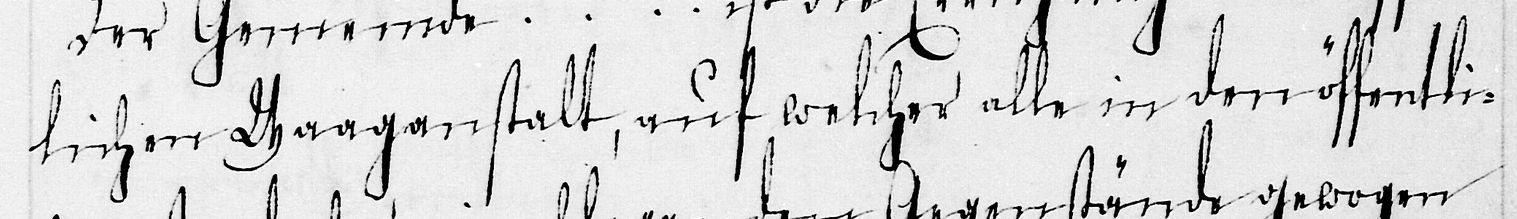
tlichen Waaganstalt, auf welcher alle in den öffentli¬
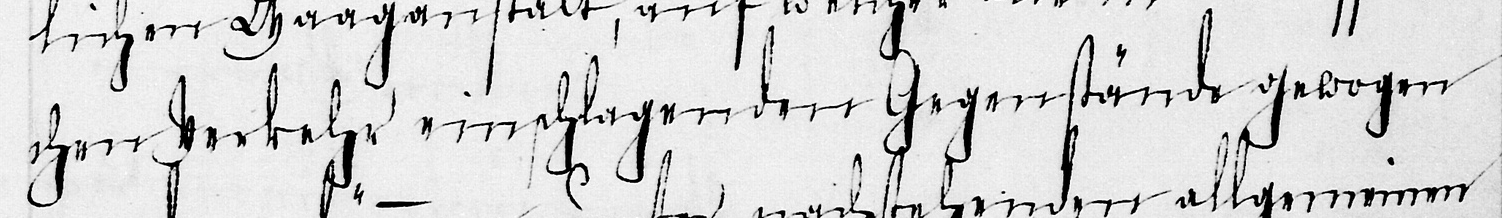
chen Verkehr einschlagenden Gegenstände gewogen
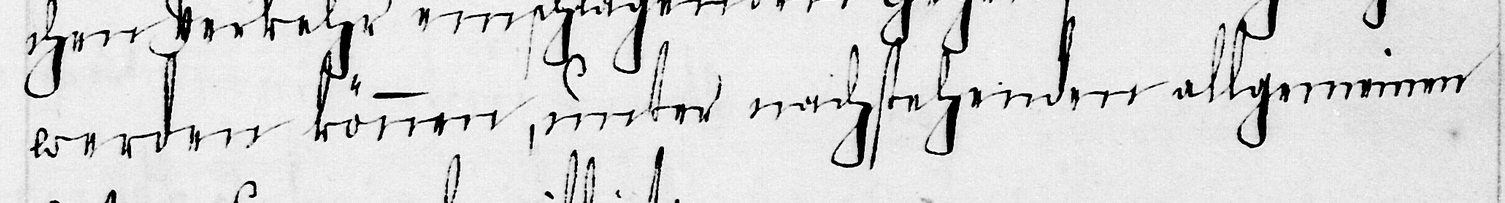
werden können, unter nachstehenden allgemeinen
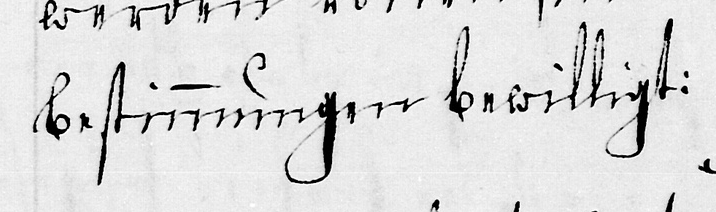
Bestimmungen bewilligt:
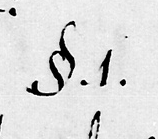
§. 1.
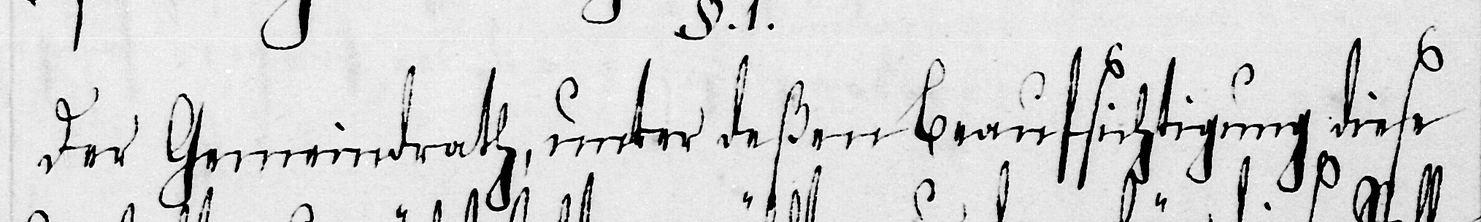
Der Gemeindrath, unter deßen Beaufsichtigung diese
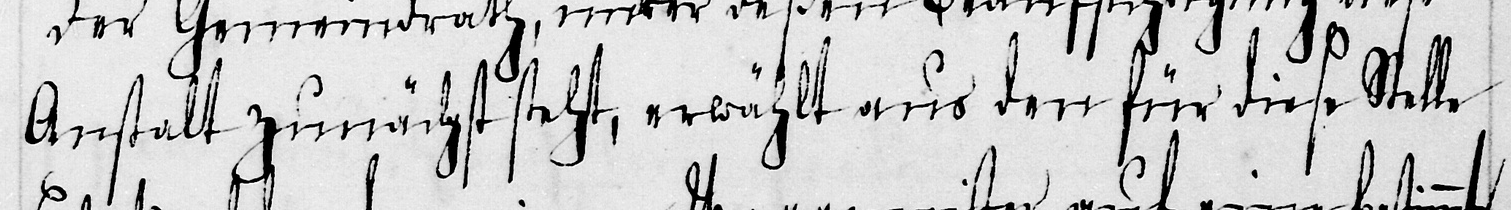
Anstalt zunächst steht, erwählt aus den für diese Stelle
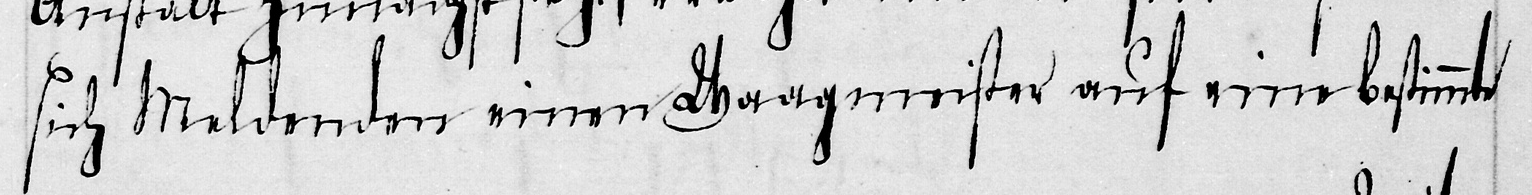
sich Meldenden einen Waagmeister auf eine bestimmte
